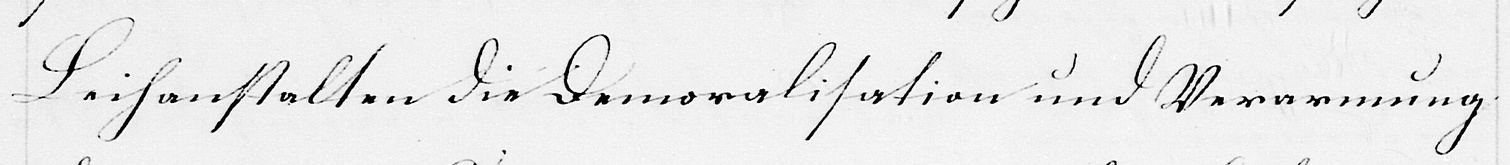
Leihanstalten die Demoralisation und Verarmung
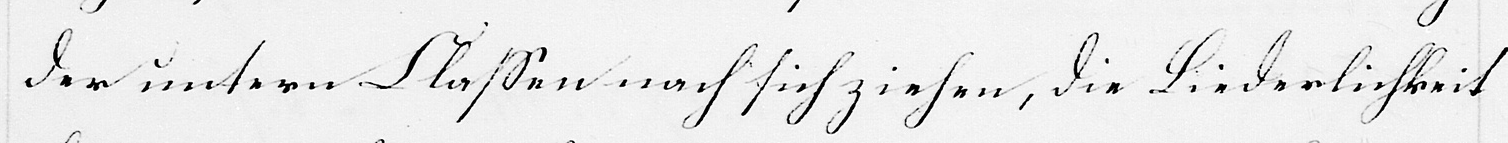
der untern Claßen nach sich ziehen, die Liederlichkeit
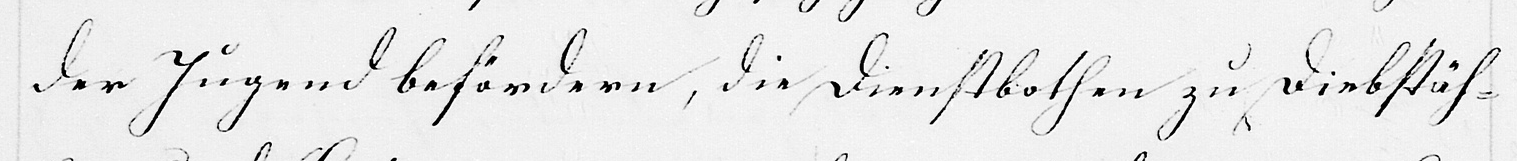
der Jugend befördern, die Dienstbothen zu Diebstäh¬
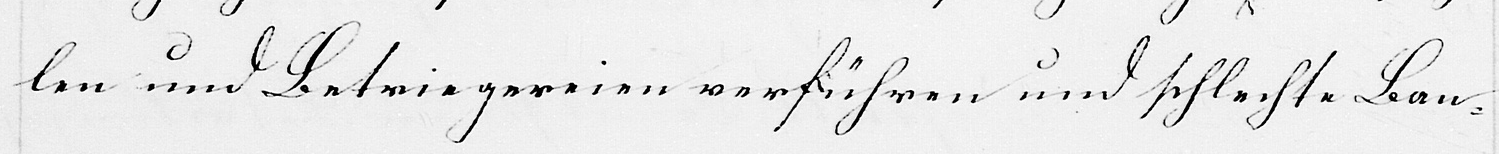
len und Betriegereien verführen und schlechte Ban¬
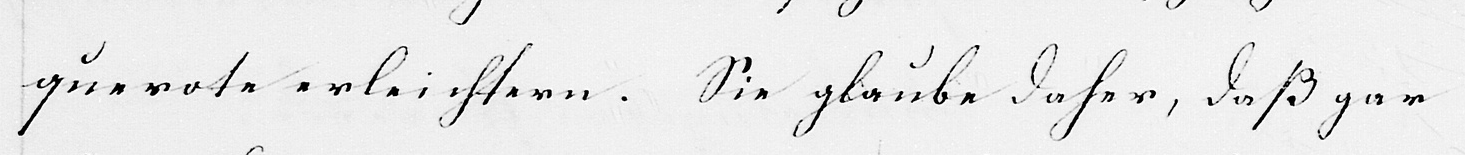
querote erleichtern. Sie glaube daher, daß gar
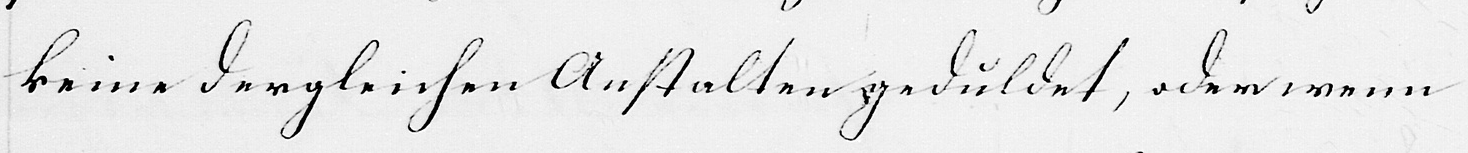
keine dergleichen Anstalten geduldet, oder wenn
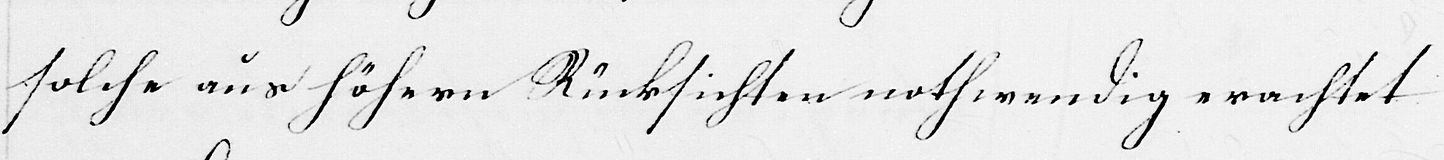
solche aus höhern Rücksichten nothwendig erachtet
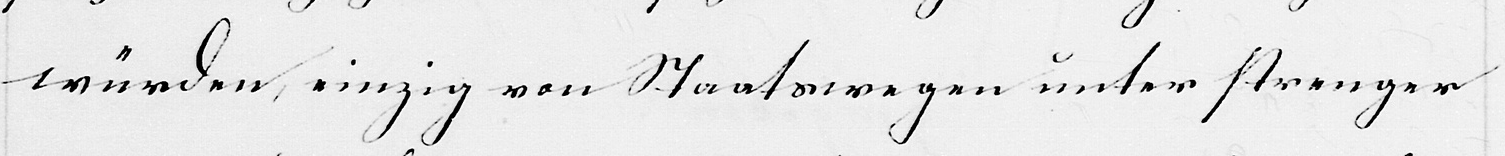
würden, einzig von Staatswegen unter strenger
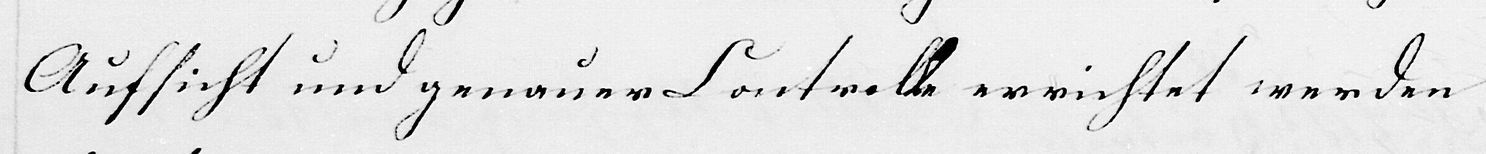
Aufsicht und genauer Controlle errichtet werden
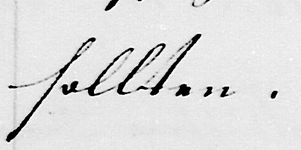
sollten.
